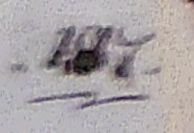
197.
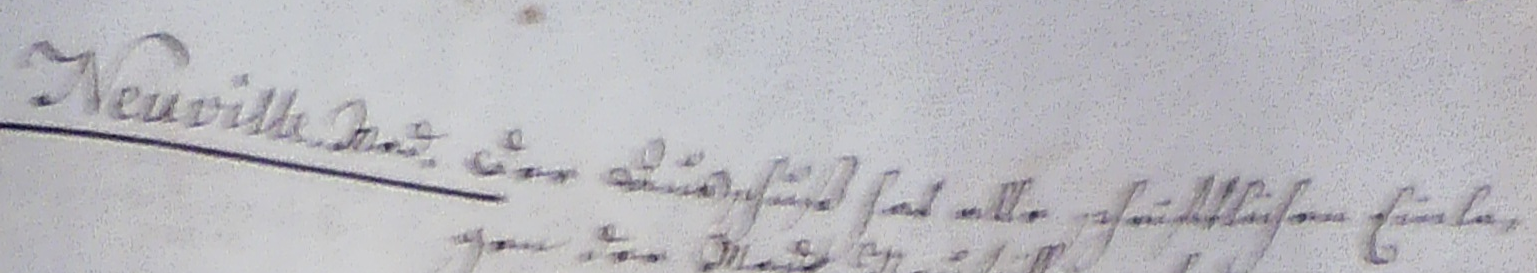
Neuville, Mad. Der Ausschuß hat alle schriftlichen Einla¬
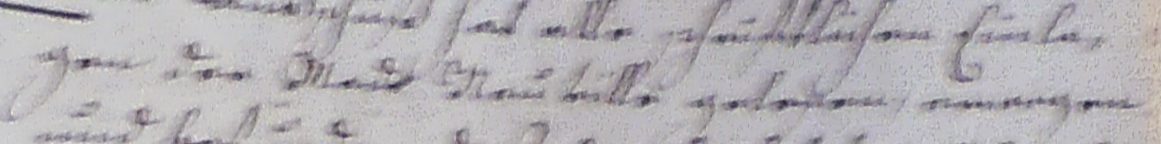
gen der Mad. Neuville gelesen, erwogen
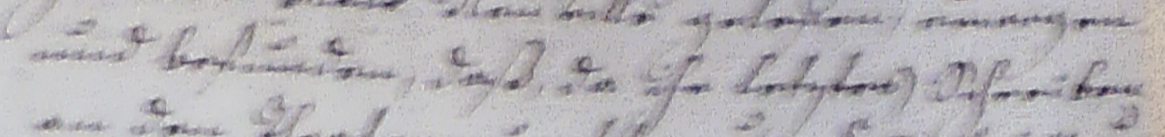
und befunden, daß, da ihr letztes Schreiben
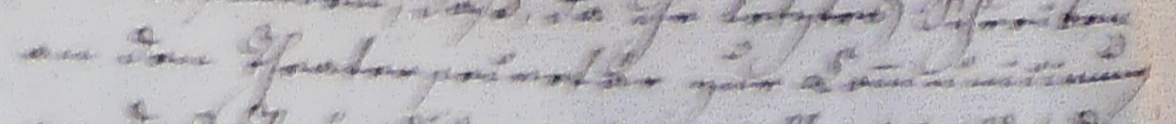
an den Theatersecretär zur Com̅unicirung
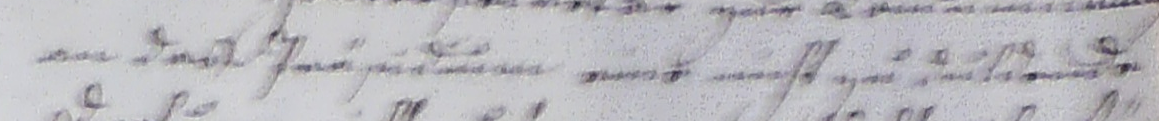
an das Präsidium eine nicht zu duldende
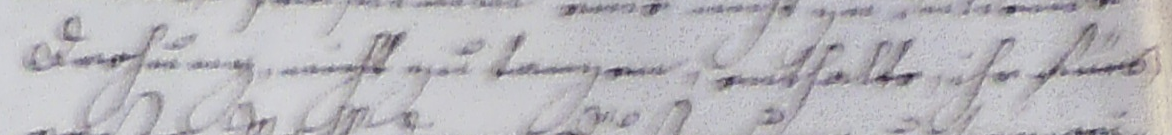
Drohung, nicht zu tanzen enthalte, ihr fürs
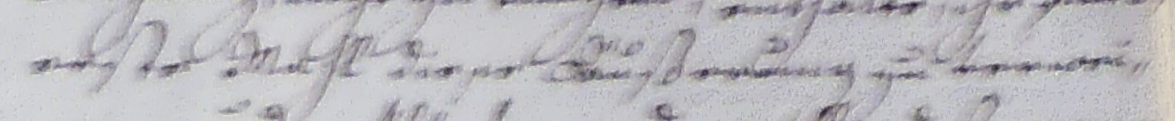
erste Mahl dieser Außerung zu verweis¬
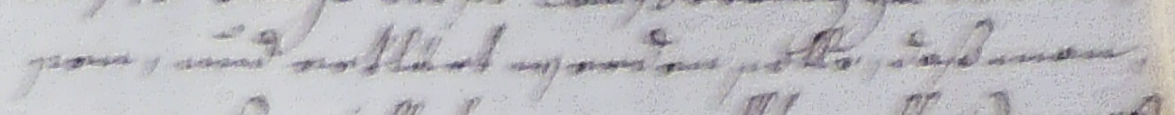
sen, und erklärt werden, solle, daß man,
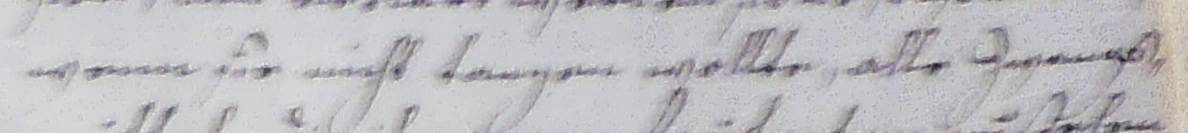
wenn sie nicht tanzen wollte, alle Zwangs¬
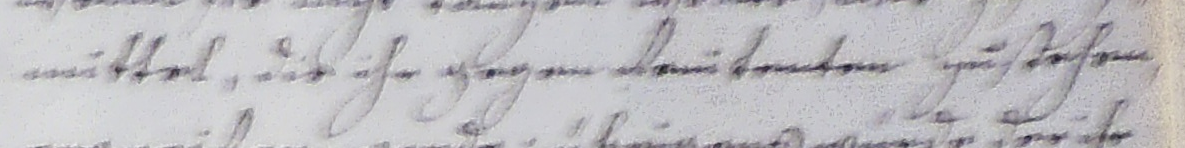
mittel, die ihr gegen Renitenten zustehen
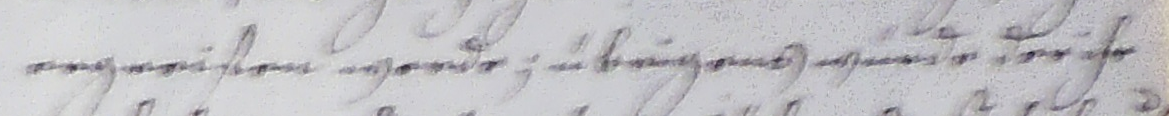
ergreifen werde; übrigens, werde der ihr
